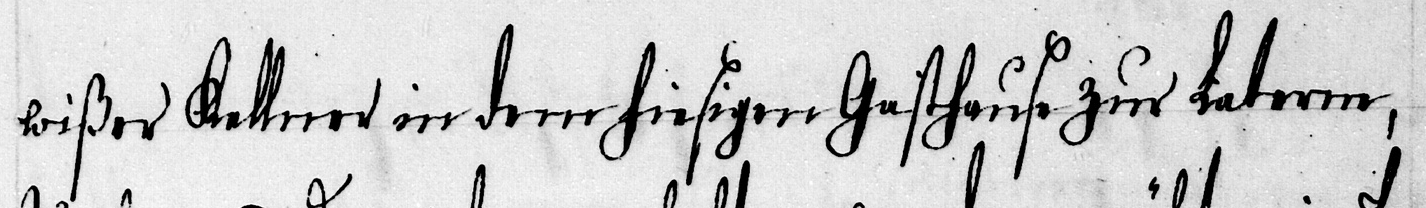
wißer Kellner in dem hiesigen Gutshause zur Laterne,
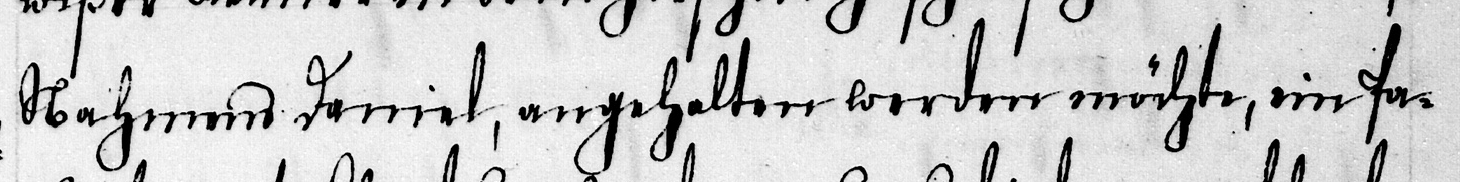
Nahmens Daniel, angehalten werden möchte, ein Pa¬
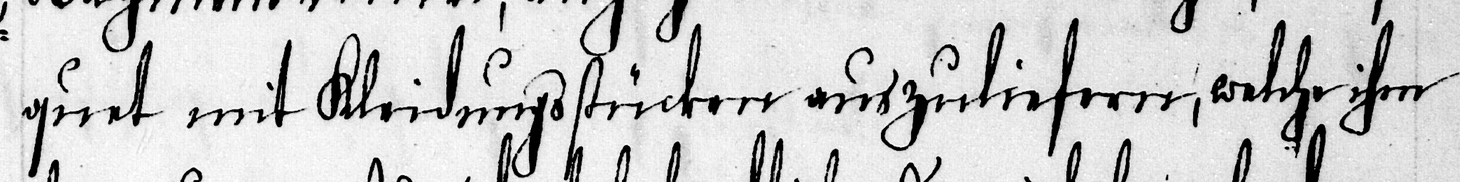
quet mit Kleidungsstücken auszuliefern, welche ihm
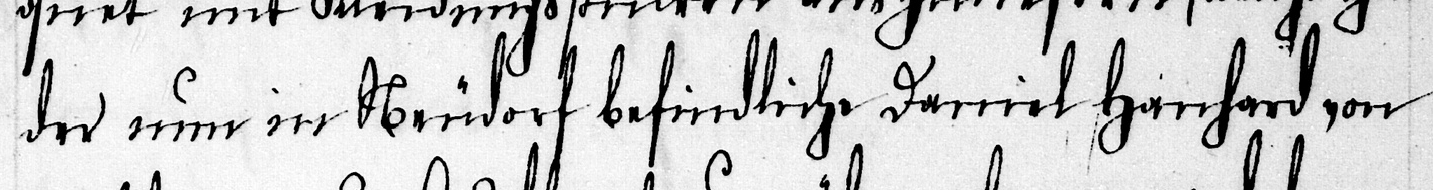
der nun in Neudorf befindliche Daniel Hanhard von
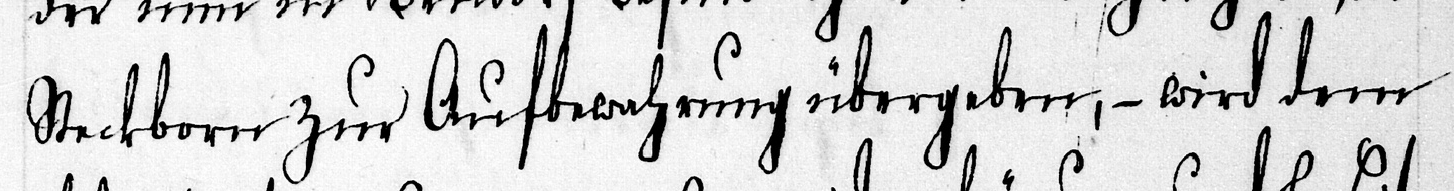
Steckborn zur Aufbewahrung übergeben, – wird dem
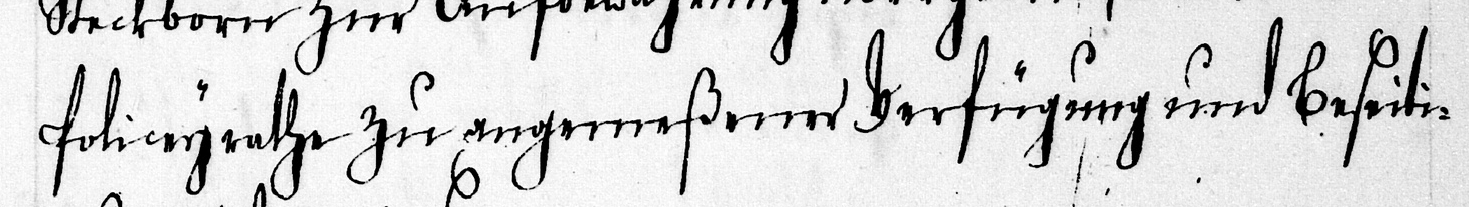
Policeyrathe zu angemeßener Verfügung und Beseiti¬
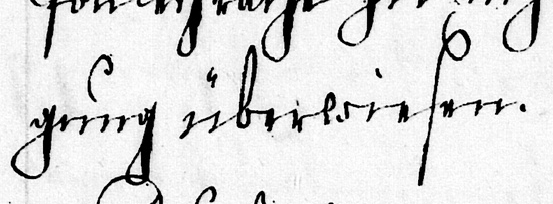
gung überwiesen.
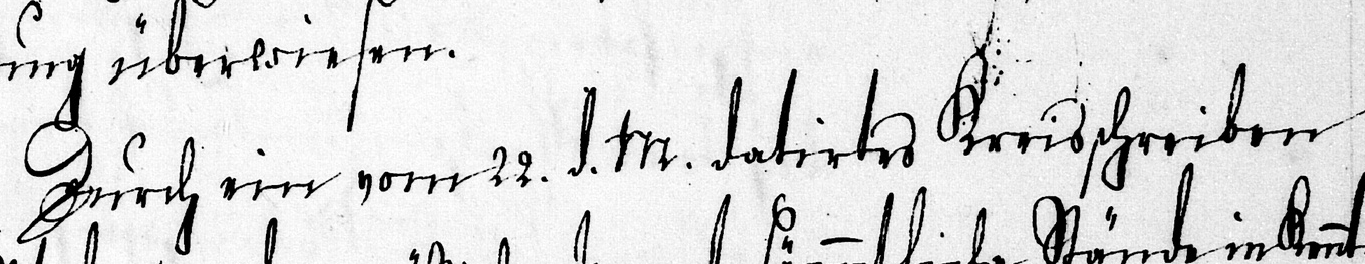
Durch ein vom 22. d. M. datirtes Kreisschreiben
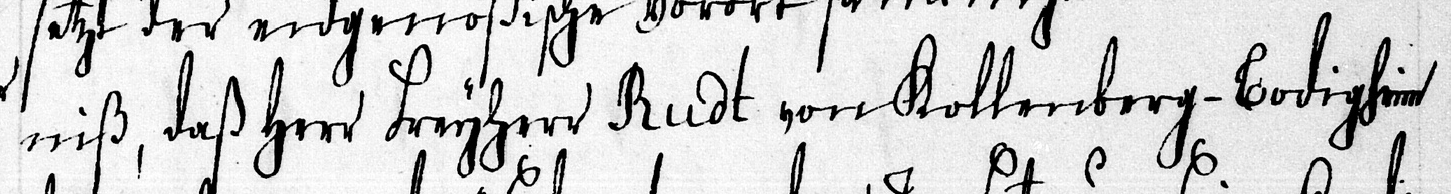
tniß, daß Herr Freyherr Rudt von Kollenberg-Bodigheim
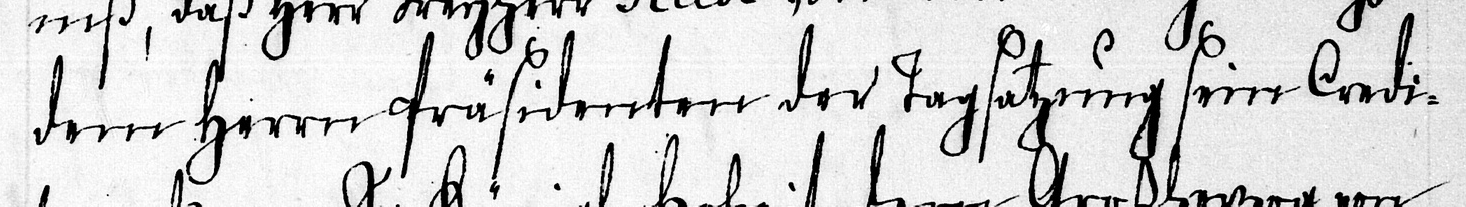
dem Herrn Präsidenten der Tagsatzung sein Credi¬
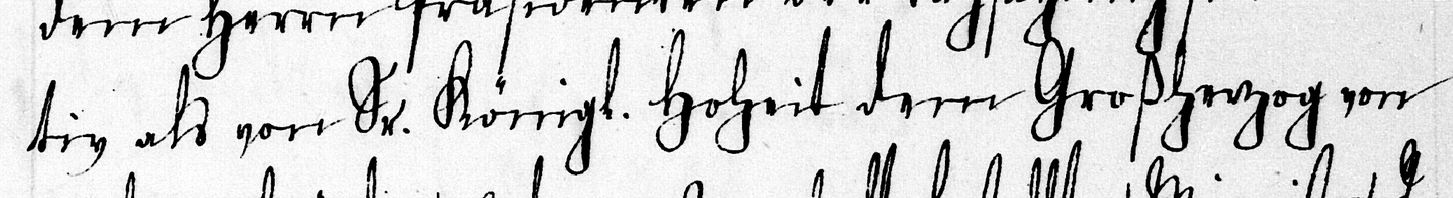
tiv als von Sr. Königl. Hoheit dem Großherzog von
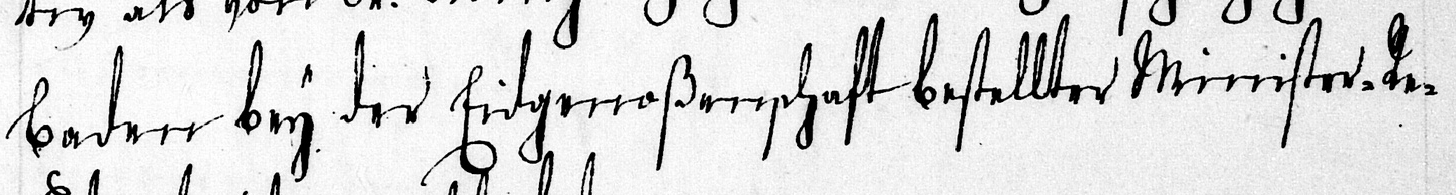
Baden bey der Eidgenoßenschaft bestellter Minister-Re¬
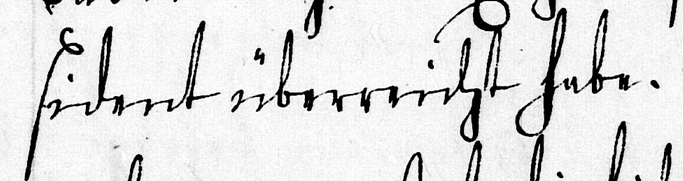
sident überreicht habe.
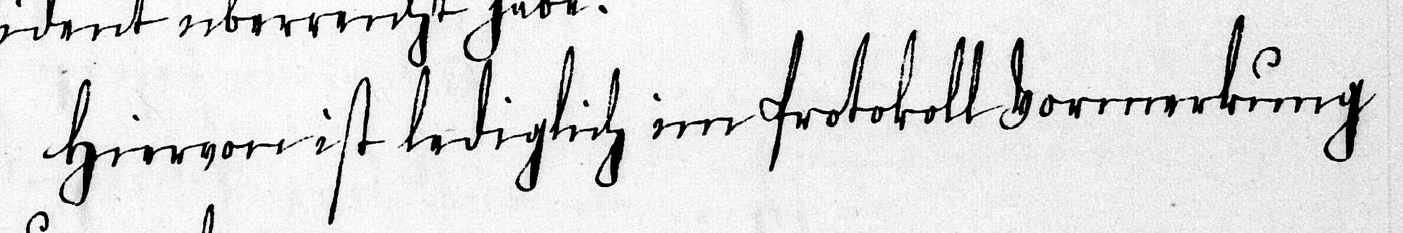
Hiervon ist lediglich im Protokoll Vormerkung
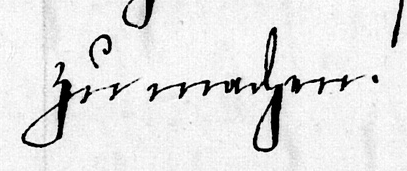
zu machen.
